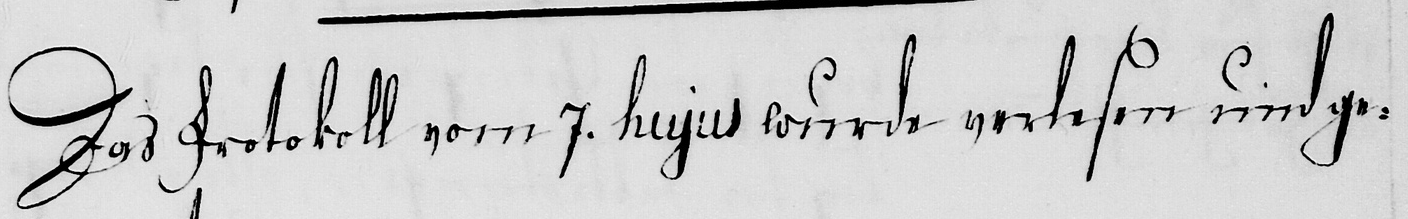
Das Protokoll vom 7. hujus wurde verlesen und ge¬
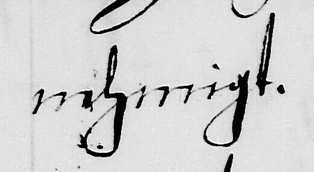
nehmigt.
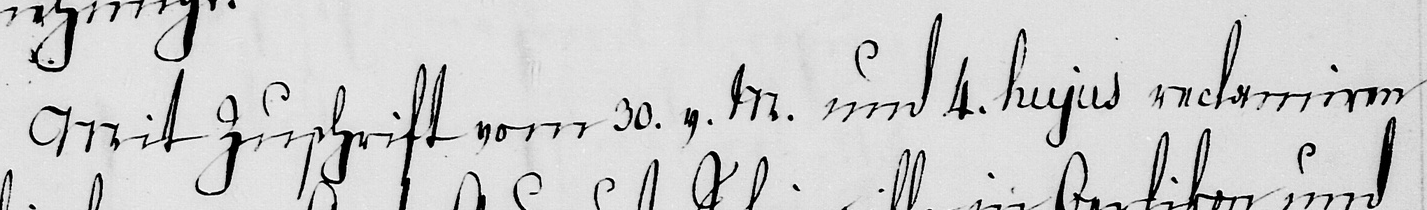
Mit Zuschrift vom 30. v. M. und 4. hujus reclamiren
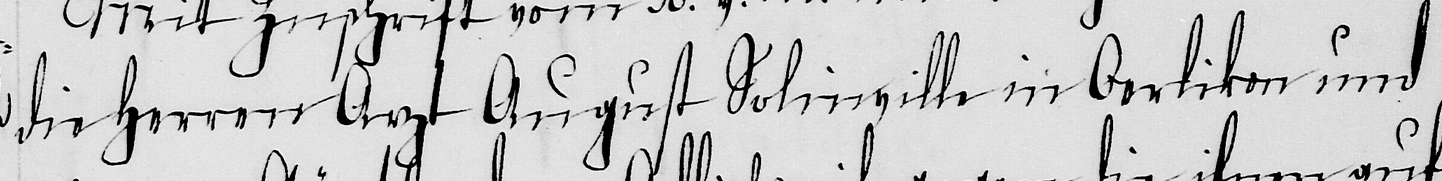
die Herren Arzt August Solinville in Oerlikon und
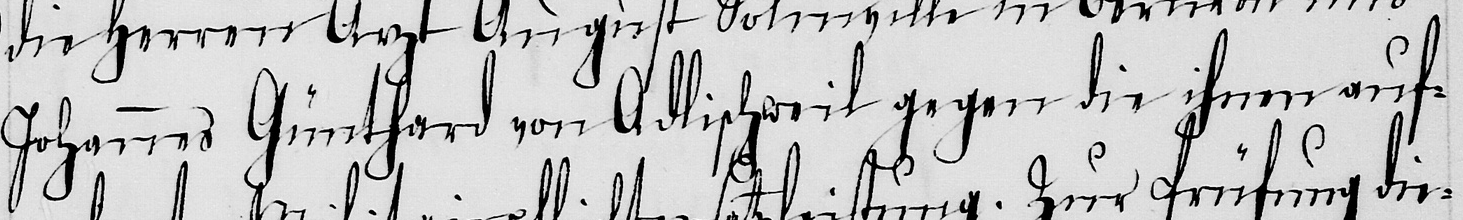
Johannes Günthard von Adlischweil gegen die ihnen auf¬
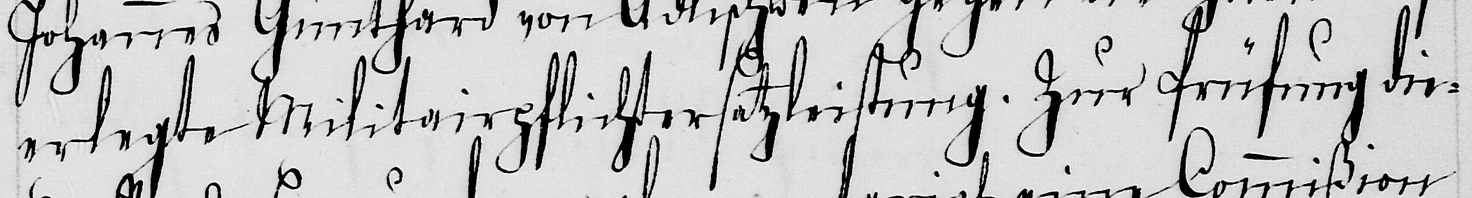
erlegte Militairpflichtersatzleistung. Zur Prüfung die¬
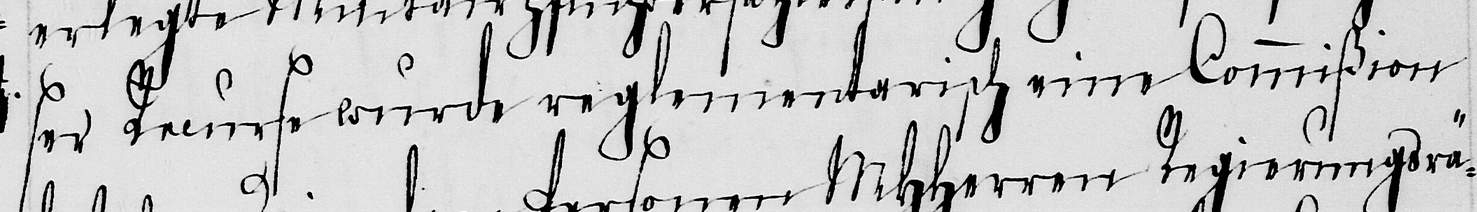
ser Recurse wurde reglementarisch eine Commißion
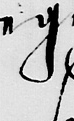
nd
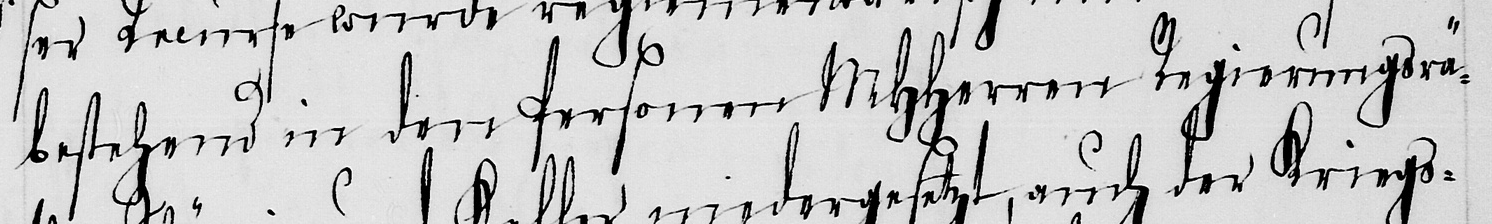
bestehend in den Personen MHHerren Regierungsrä¬
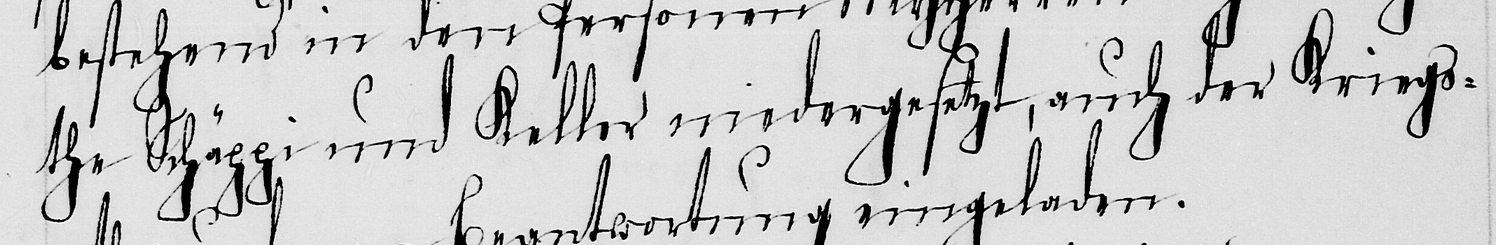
the Schäppi und Keller niedergesetzt, auch der Kriegs¬
